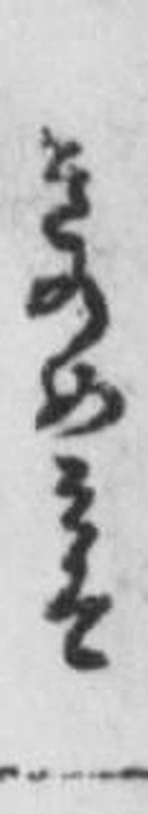きのめみそ
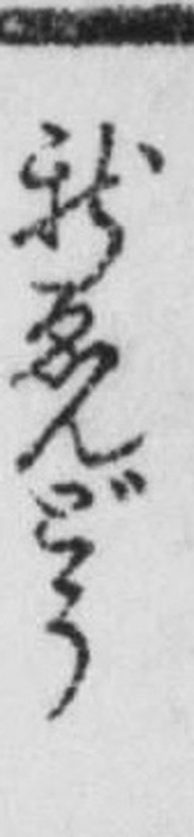新ゑんどう
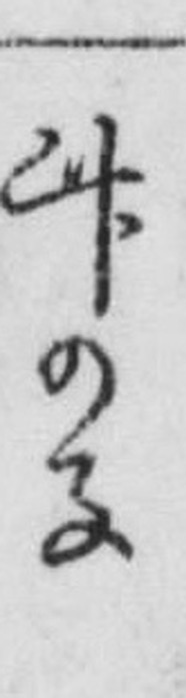竹の子
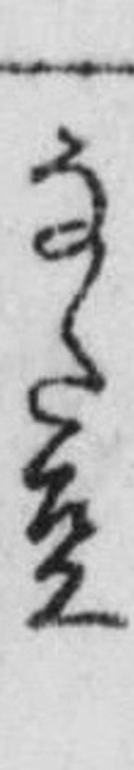なた豆
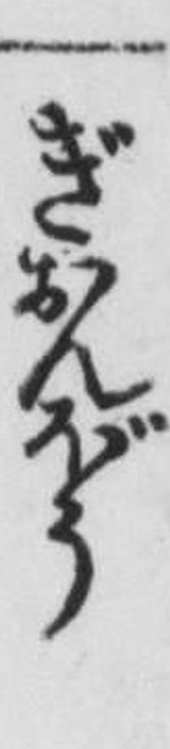ぎおんぼう
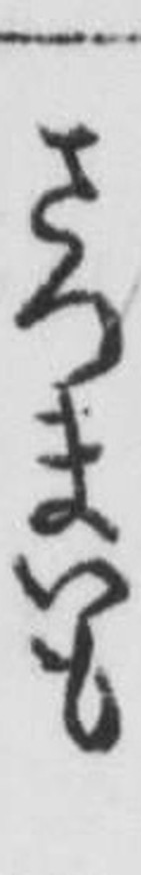さつまいも
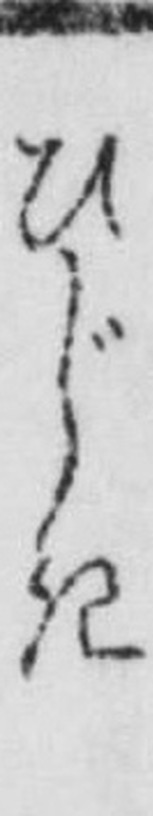ひじき
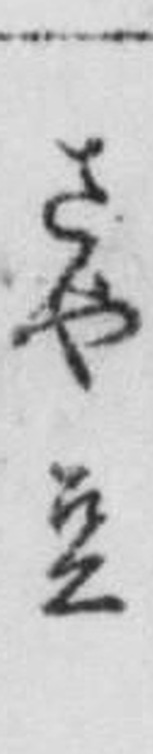さや豆
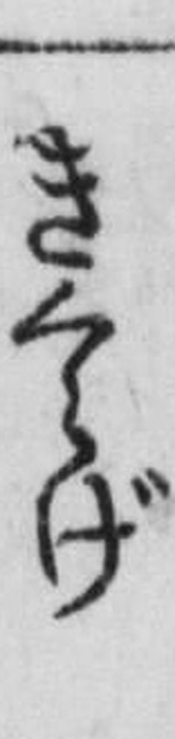きくらげ
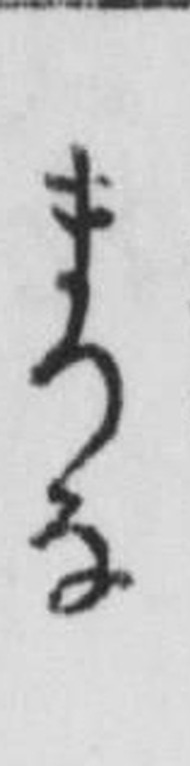まつな
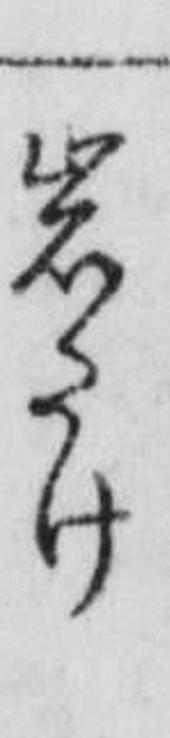岩たけ
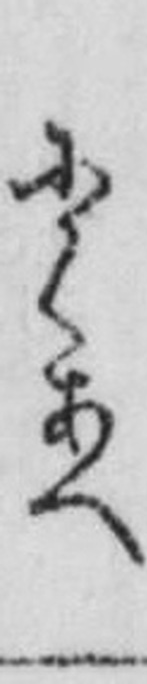にくあへ
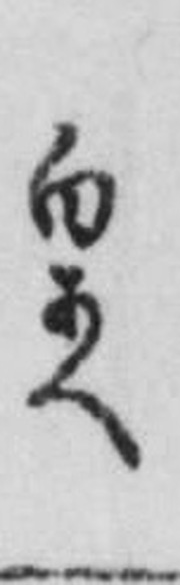白かん
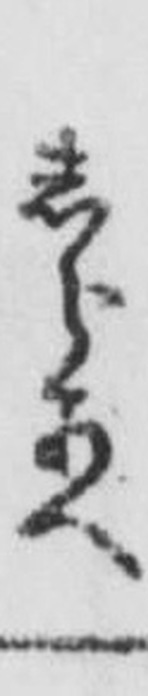しらあへ

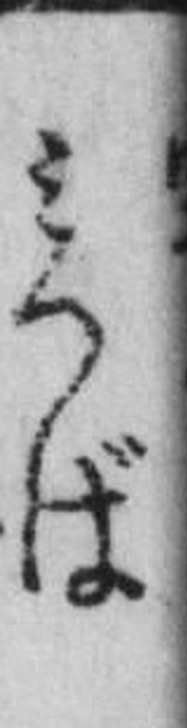みつば
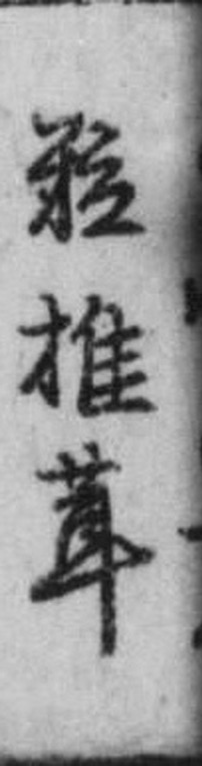膾椎茸
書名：精進魚類間合料理/早速庖丁
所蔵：大阪府立大学学術情報センター 国文学研究資料館
